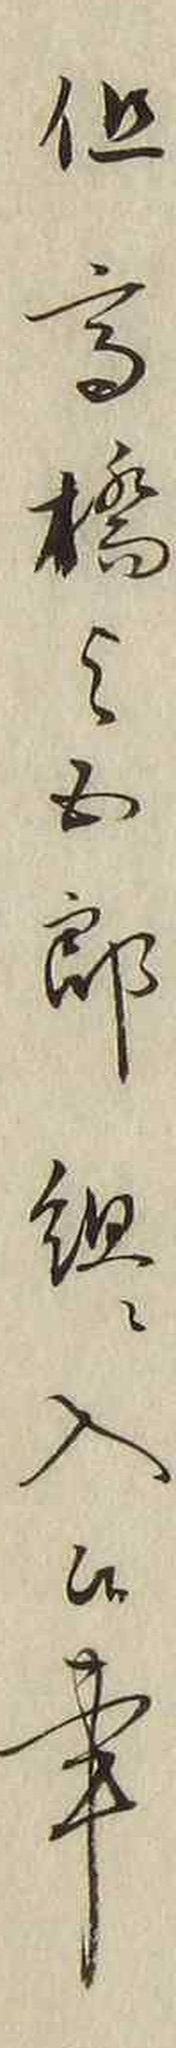但高橋与五郎組ニ入候事

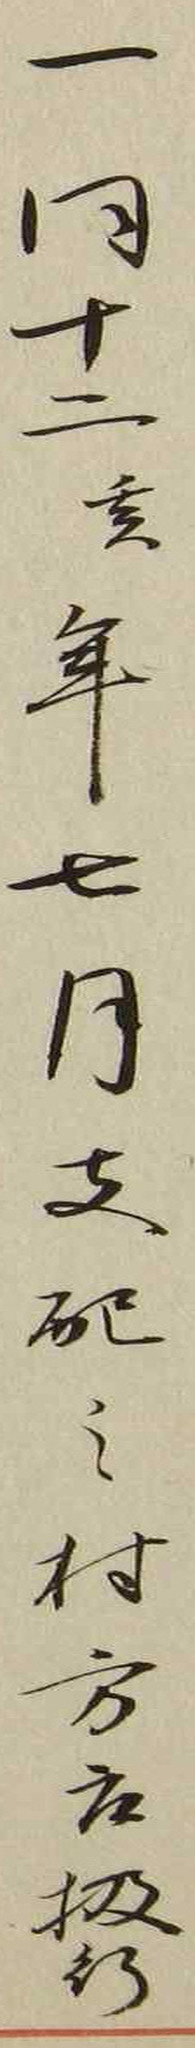一同十二亥年七月支配之村方取扱行
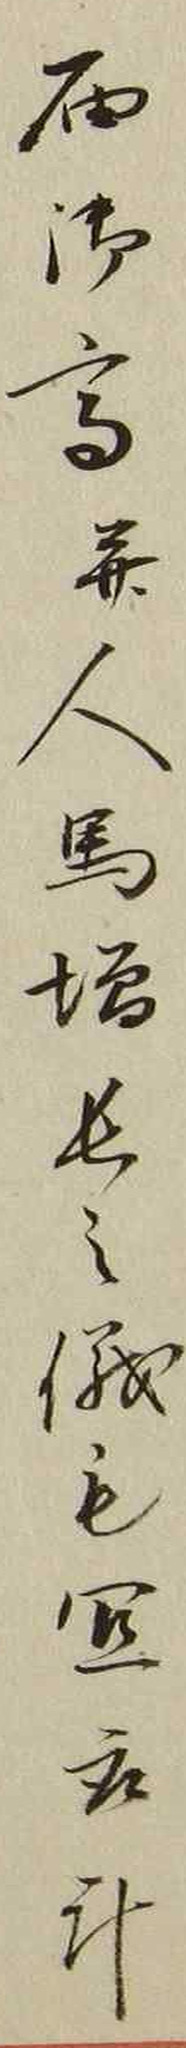届御高并人馬増長之儀も宜取計
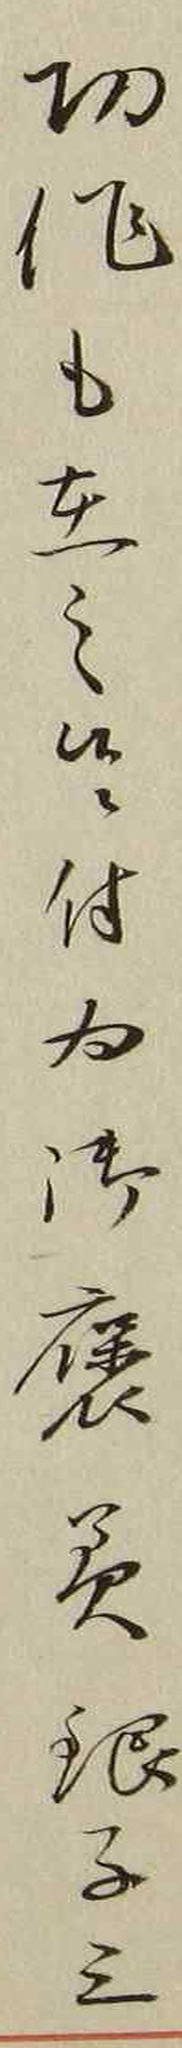功作も在之候ニ付為御褒美銀子三
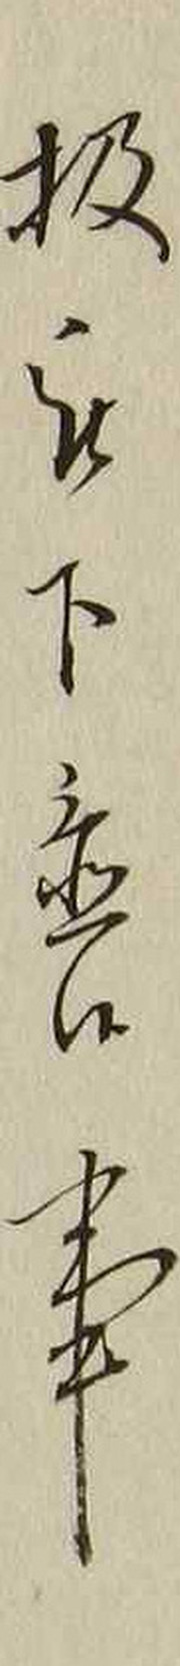扱被下置候事
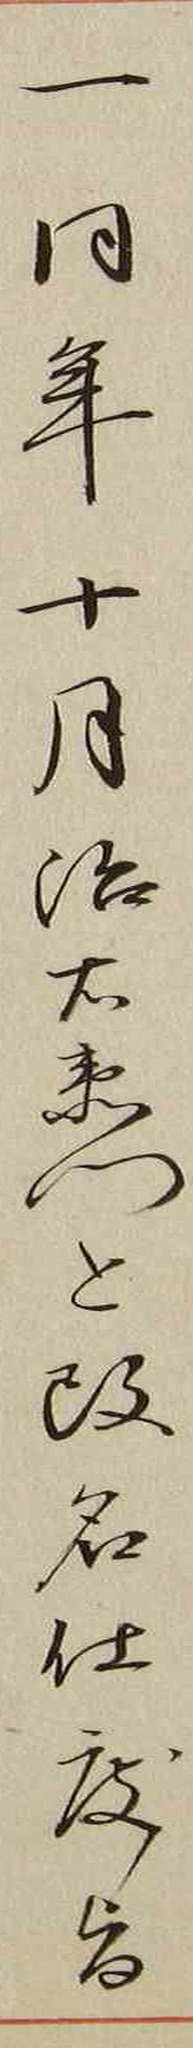一同年十月治右衛門と改名仕度旨
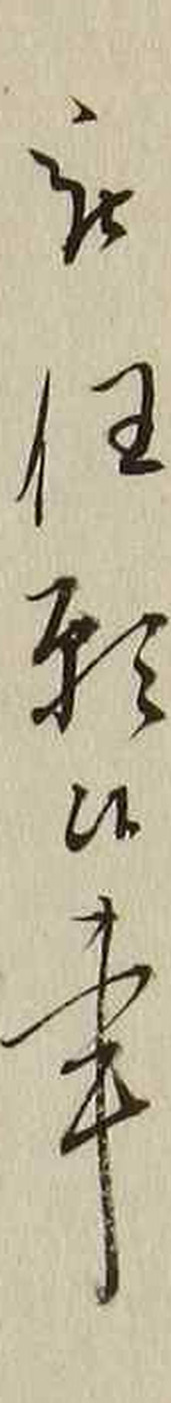被任願候事
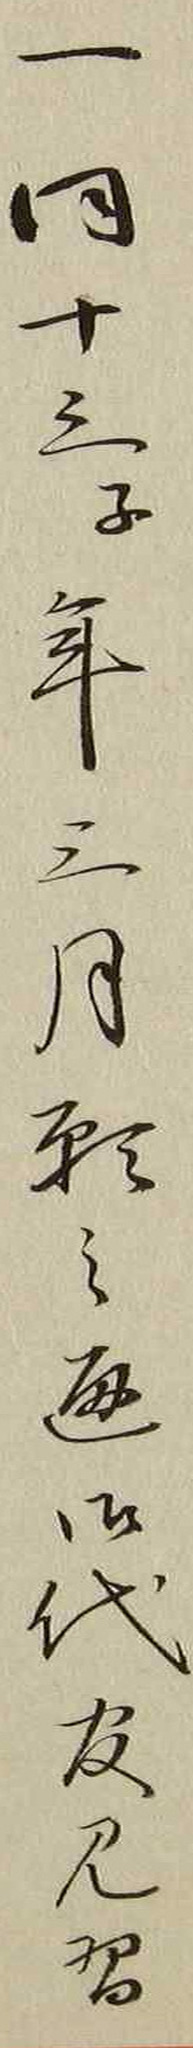一同十三子年三月願之通御代官見習
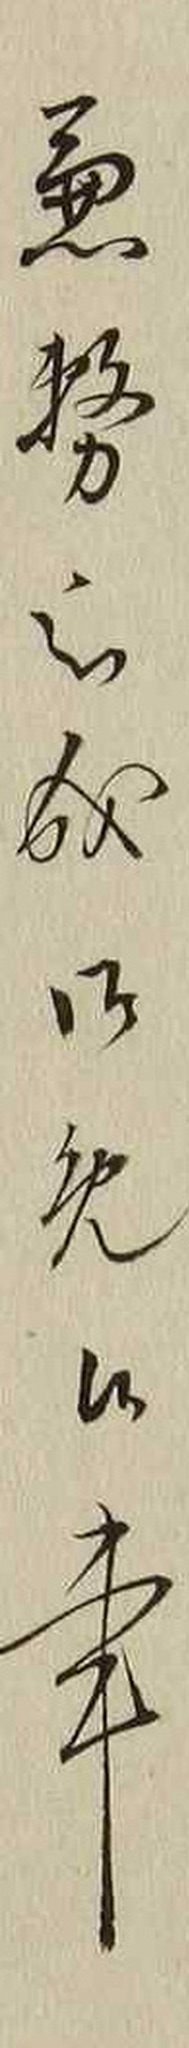兼務被成御免候事
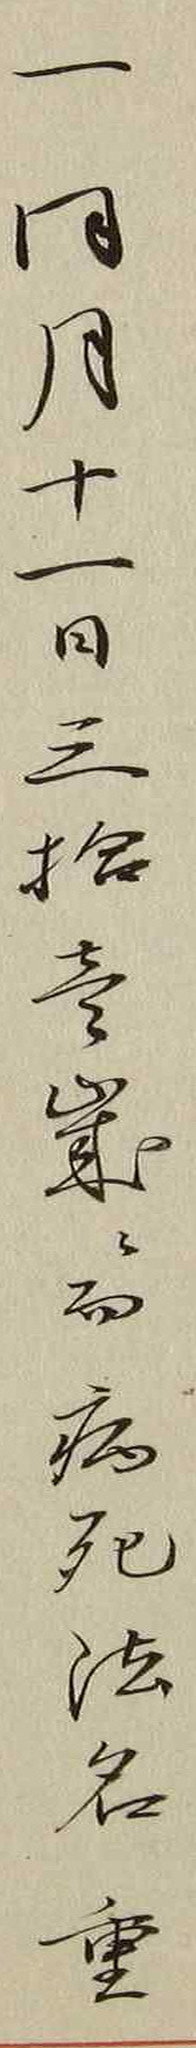一同月十一日三拾壱歳ニ而病死法名重
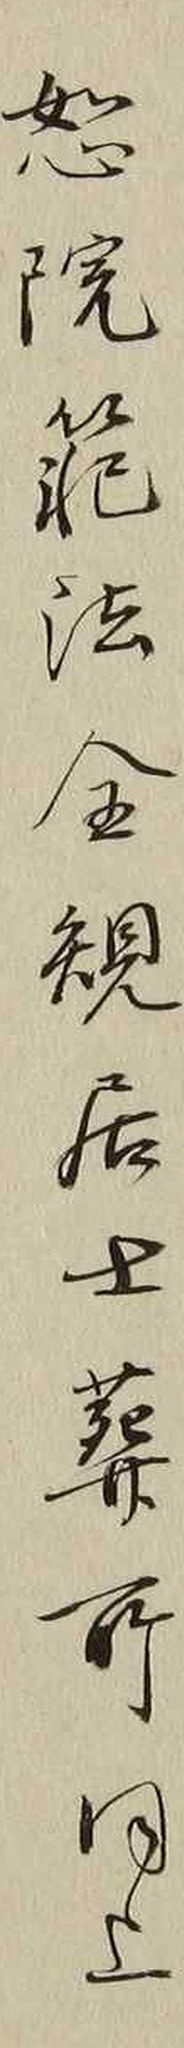怒院範法全規居士葬所同上
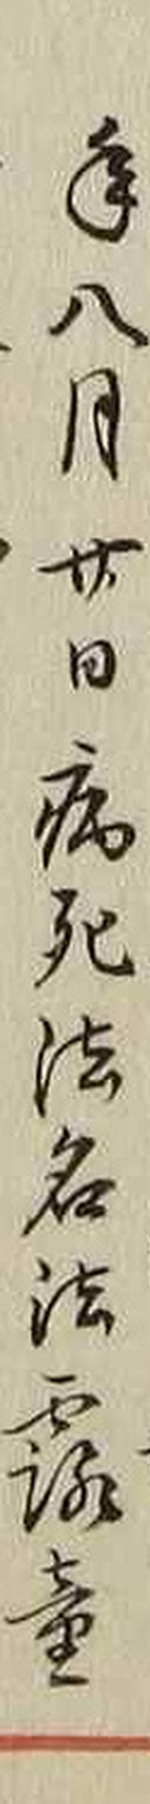年八月廿日病死法名法露童
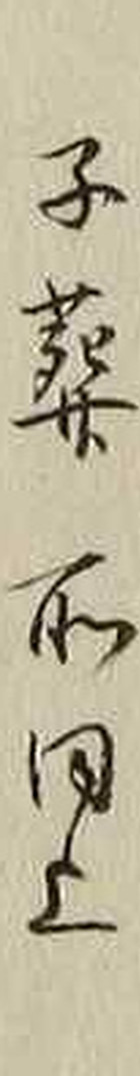子葬所同上
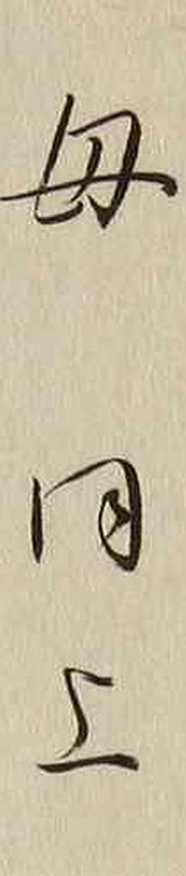母同上
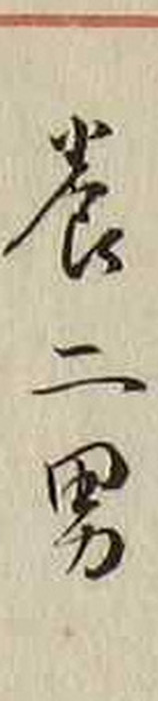養二男
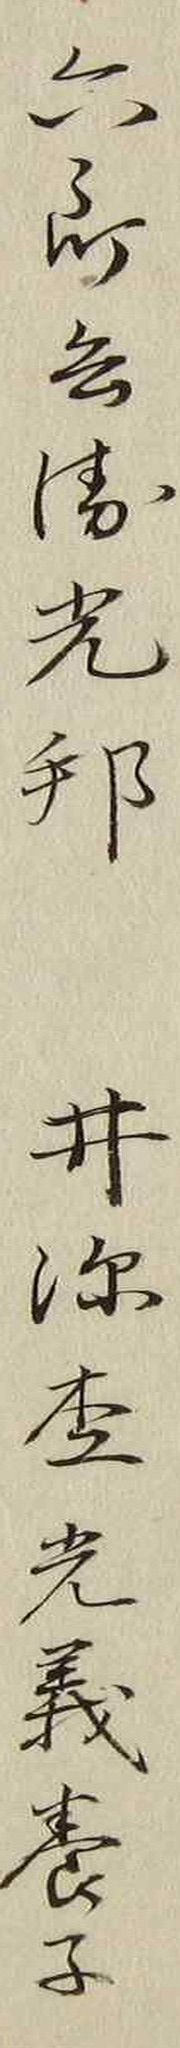六郎兵衛光邦井深杢光義養子
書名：諸士系譜　巻之22　い之部22
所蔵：会津若松市立会津図書館
